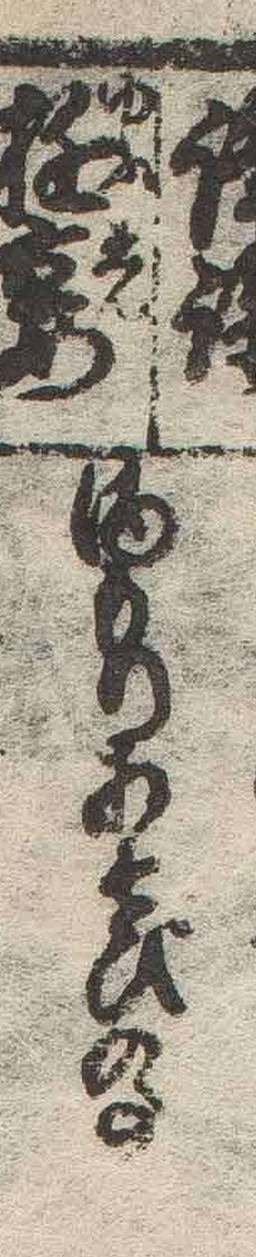遊宴酒もりあそびの事
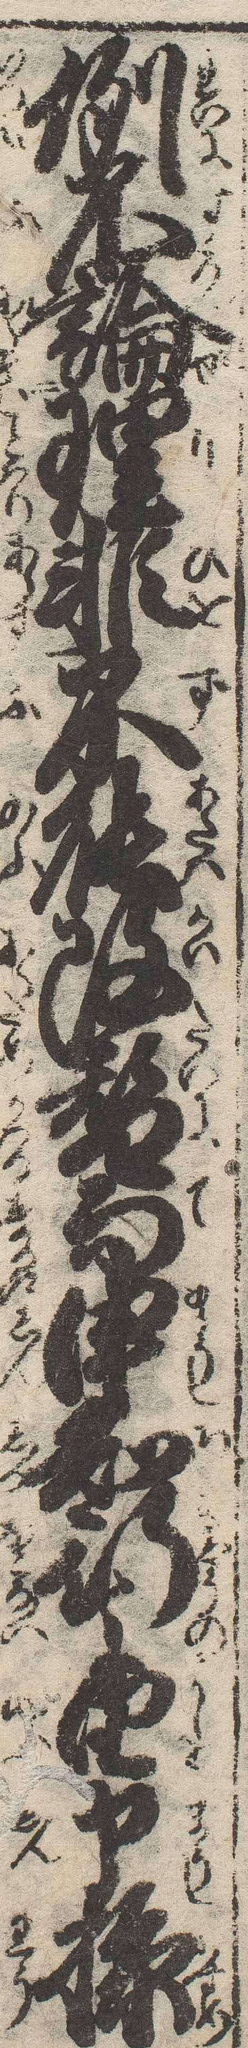例不論理非不能改替而申知行之由申掠
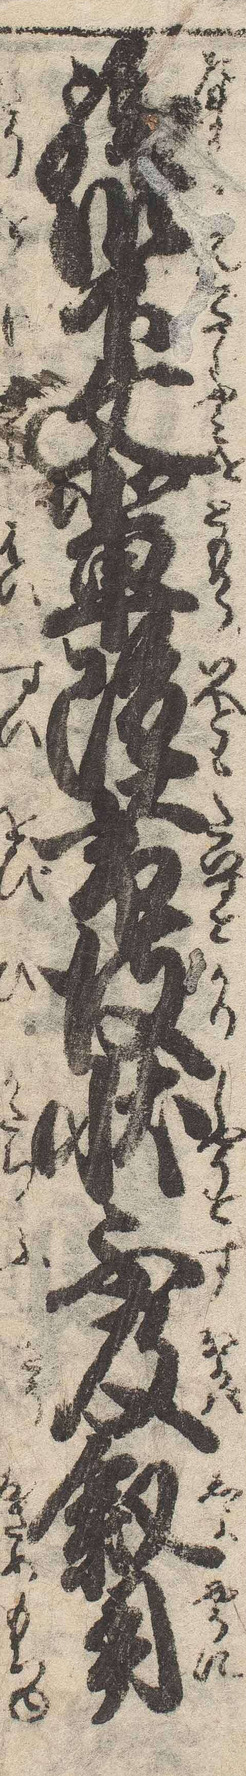給御下文輩雖帯彼状不及叙用
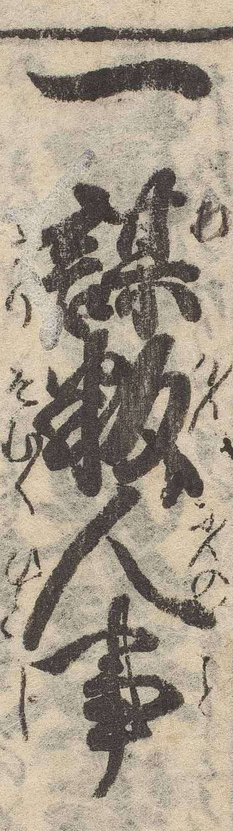一謀叛人事
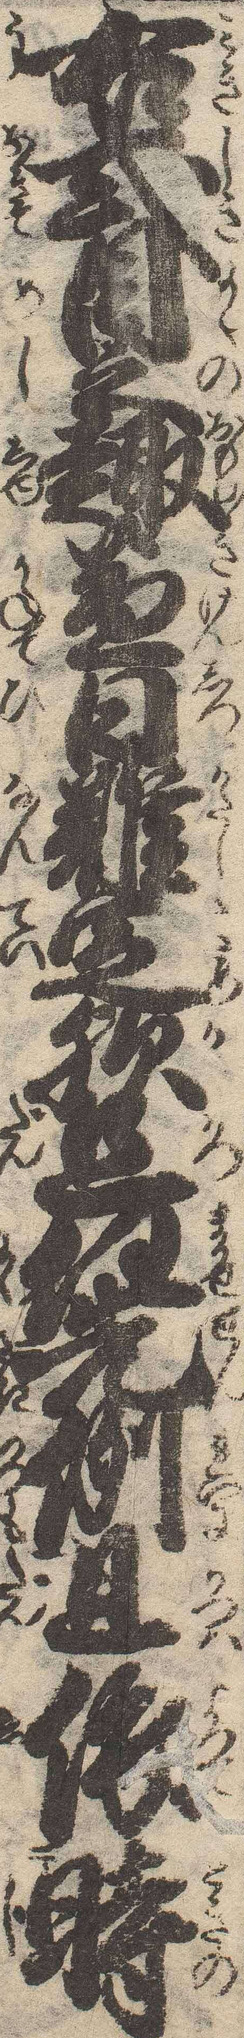右式目之趣兼日難定欤且任先例且依時
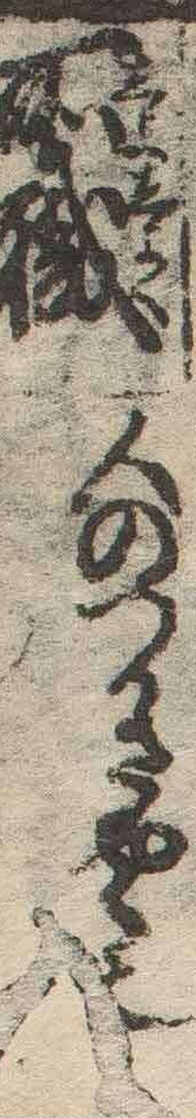所職人のつかさやく也
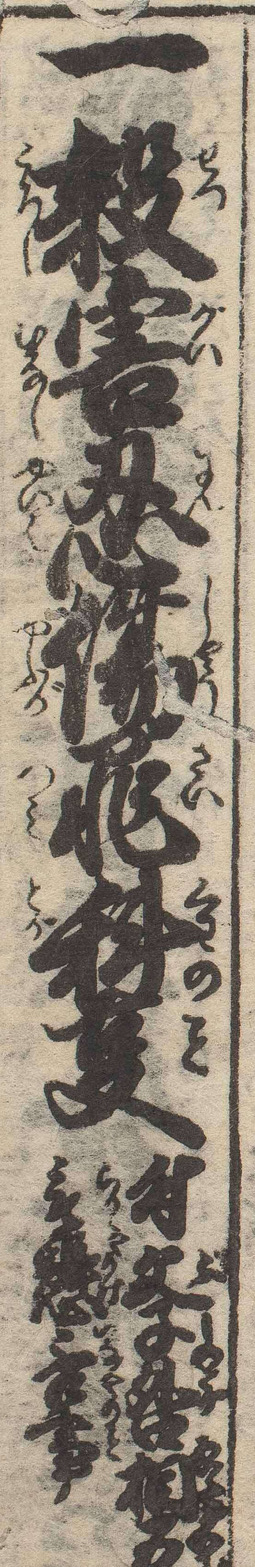一殺害忍傷罪科事
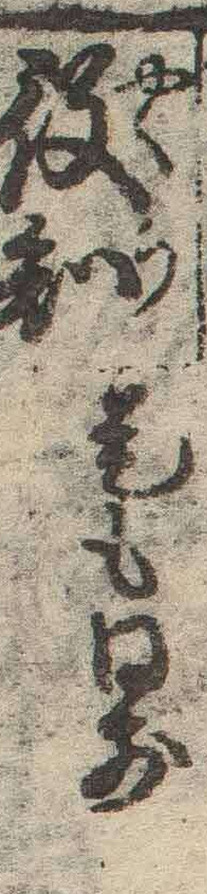役知是も同前
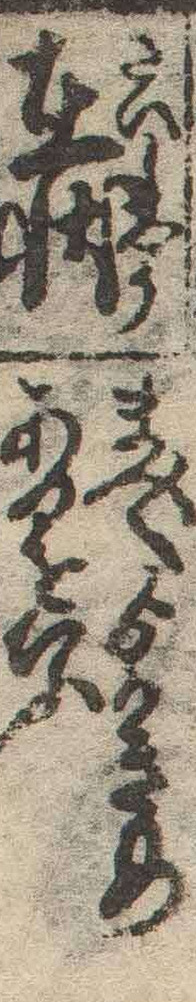あるをいふ
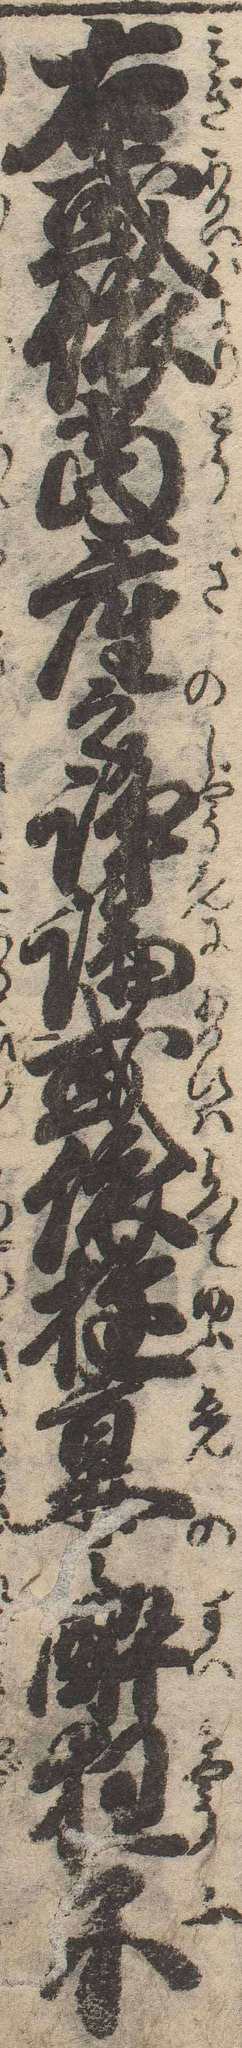右或依當座之諍論或依遊宴之酔狂不
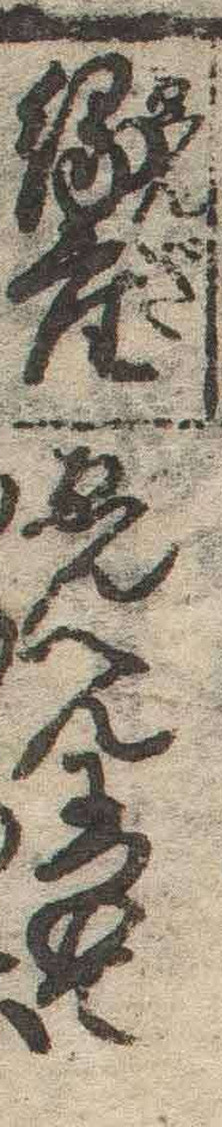縁座ゑんへんにつれて
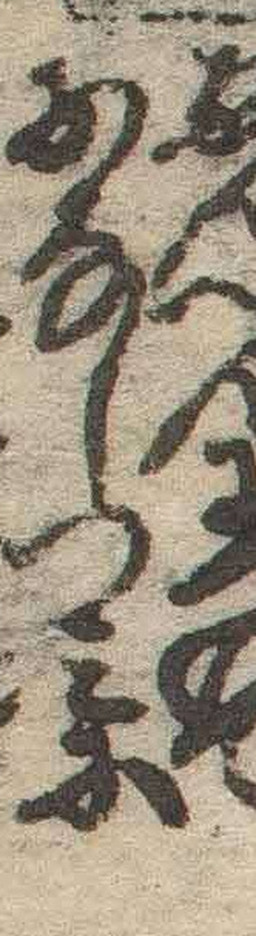おなしつみに
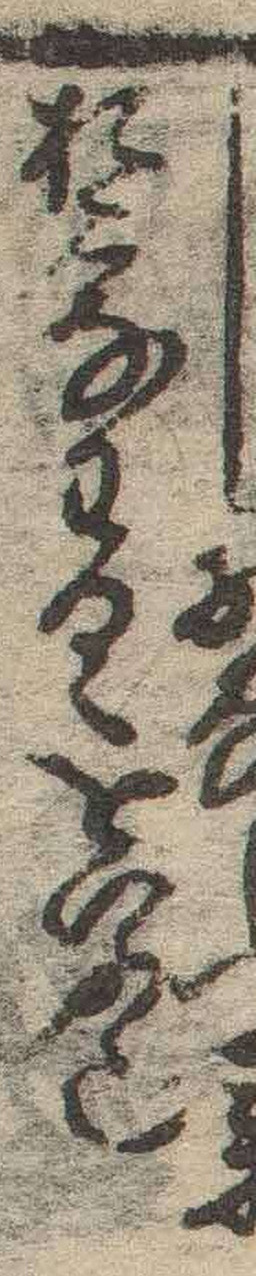おこなわることをいふ也
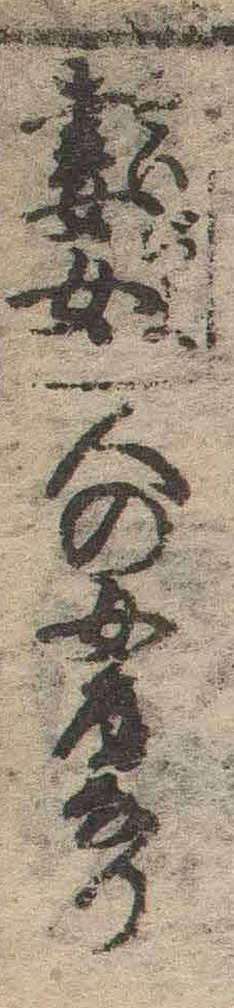妻女人の女房なり
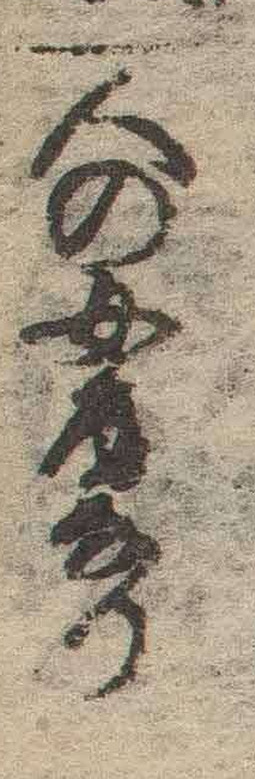妻女人の女房なり
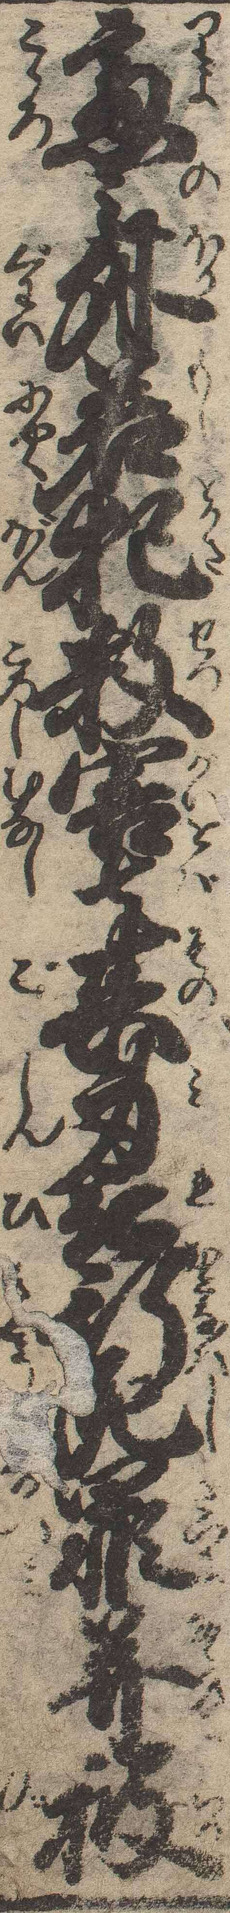慮之外若犯殺害者其身被行死罪幷被
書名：御成敗式目絵抄
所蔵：東京学芸大学附属図書館 国文学研究資料館
